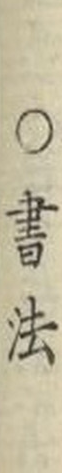○書法
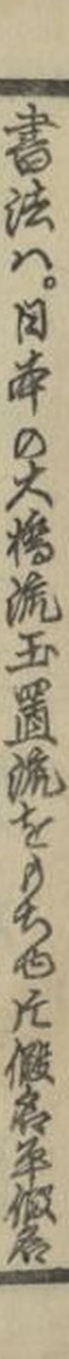書法は。日本の大橋流玉置流をもちゆ片仮名平仮名
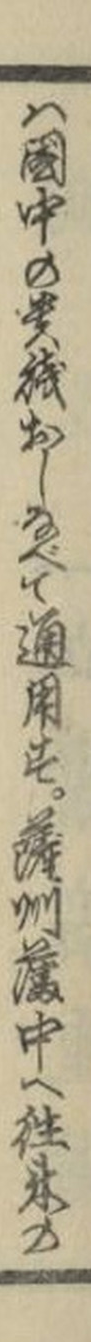は国中の貴賤おしなべて通用す。薩州藩中へ往来の
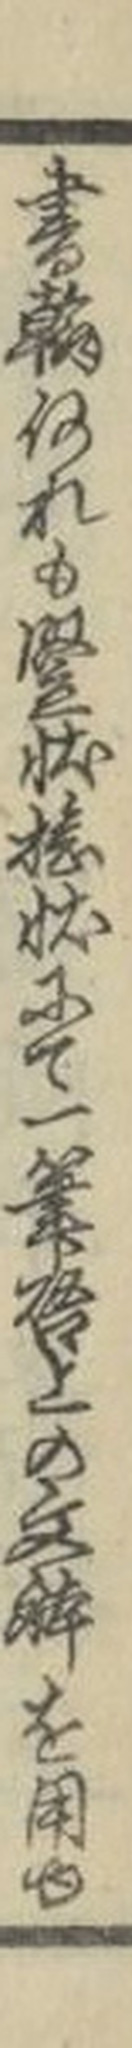書翰何れも竪状捻状にて一筆啓上の文体を用ゆ
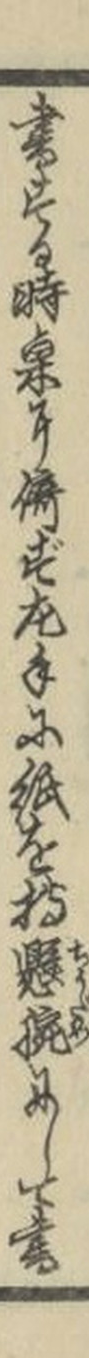書する時桌に倚ず左手に紙を持懸腕にして書
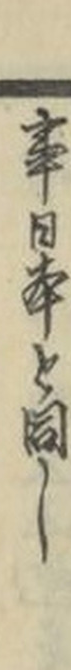事日本と同し
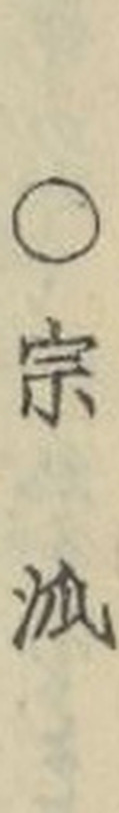○宗派
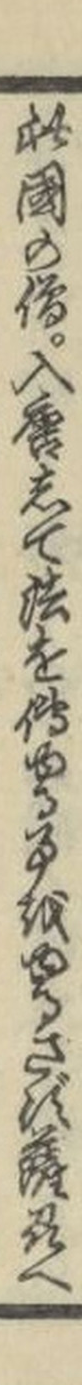此国の僧。入唐して法を伝ゆる事をゆるさず薩州へ
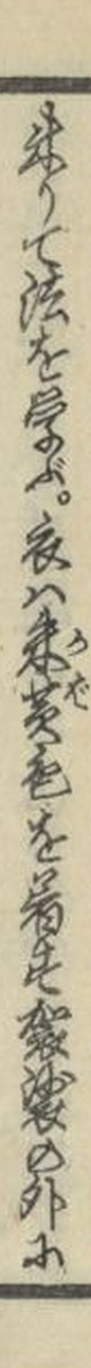来りて法を学ぶ。衣は朱黄色を着す。袈裟の外に
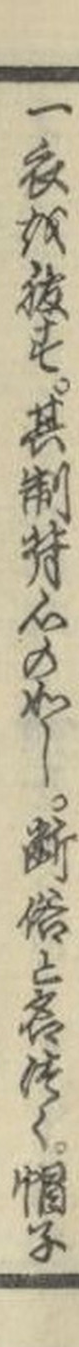一衣を服す。其制背心の如し。断俗と名つく。帽子
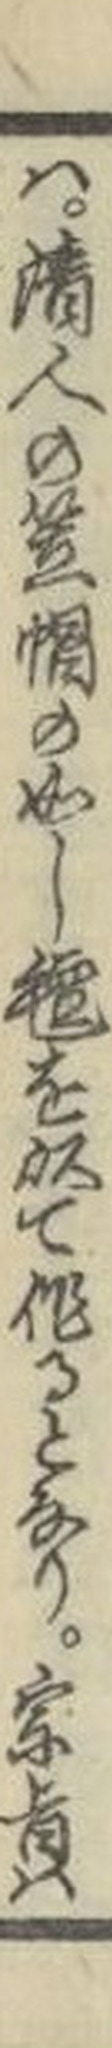は。清人の笠帽の如し氈を以て作るとなり。宗旨は
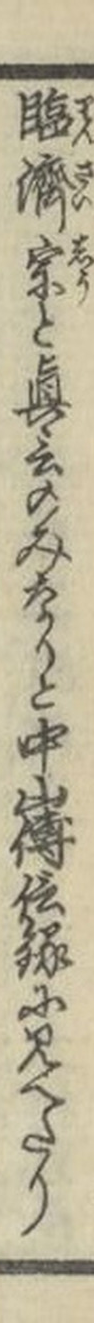臨済宗と真言のみなりと中山伝信録に見へたり
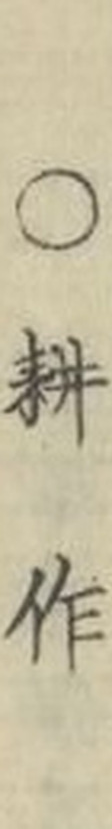○耕作
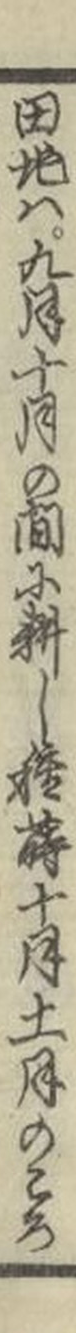田地は。九月十月の間に耕し種蒔十月十一月のころ
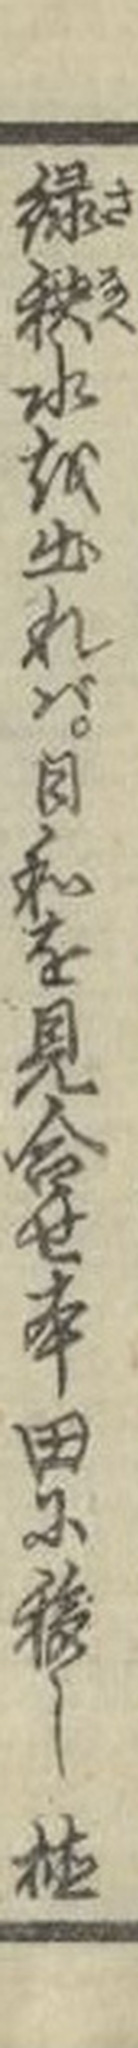緑秧水を出れば。日和を見合せ本田に移し植
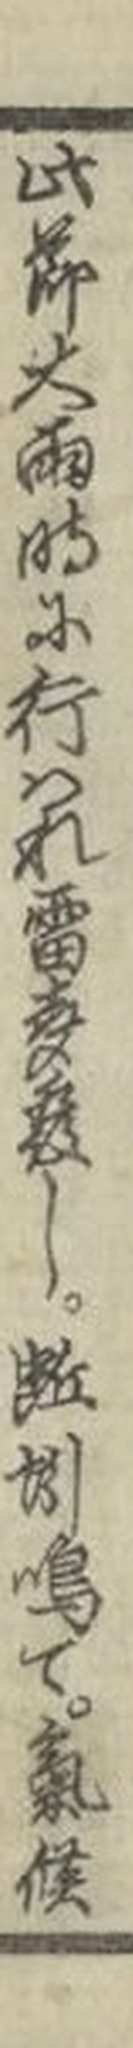此節大雨時に行はれ雷声発し。蚯蚓鳴て。気候
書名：琉球解語
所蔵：University of the Ryukyus Library
